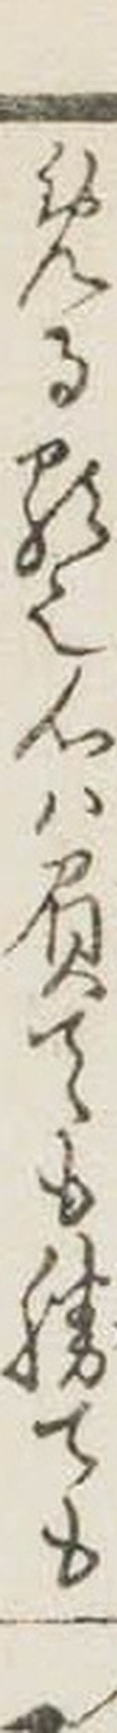める歌也心は負ても勝ても
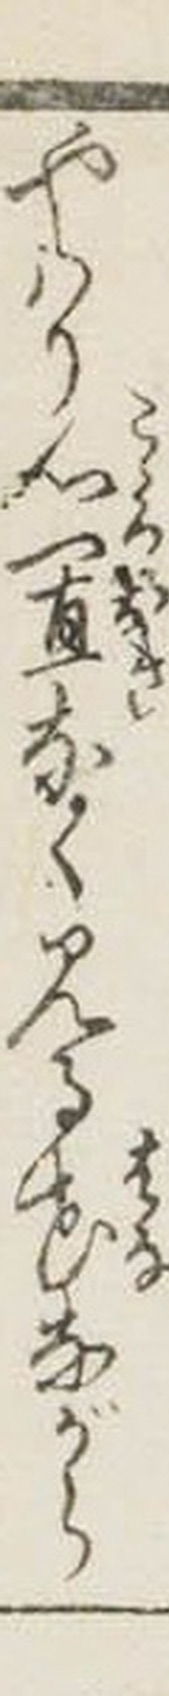やはり心置なく見る花ながら
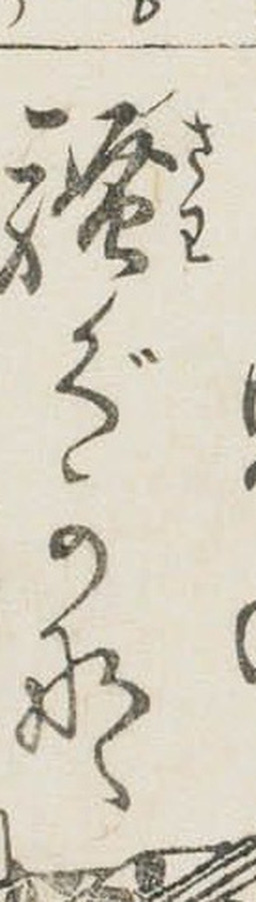騒ぐかな
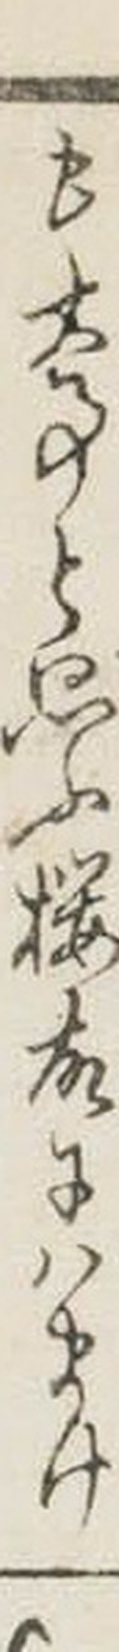も大事と思ふ桜故にはまけ
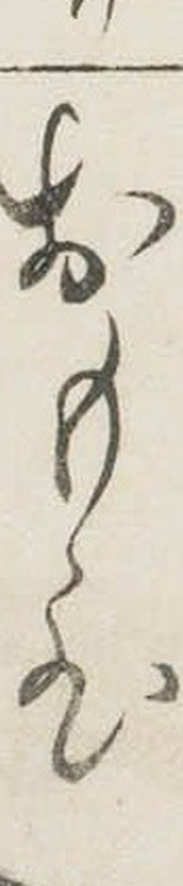おもひ
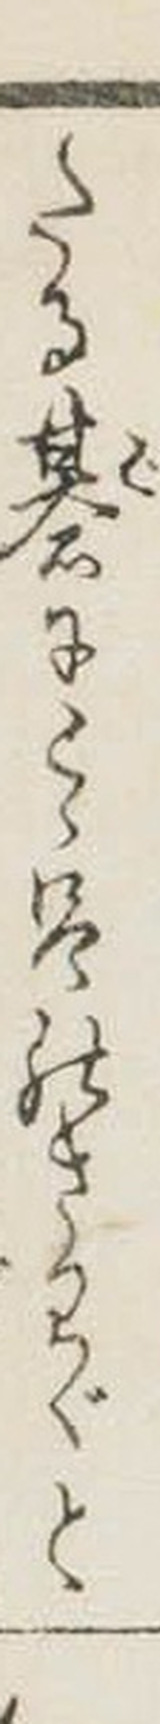たる碁にこゝろのさわぐと
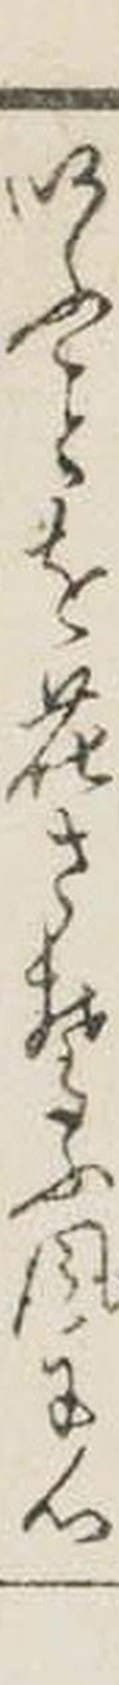いふことを花さそふ風に心
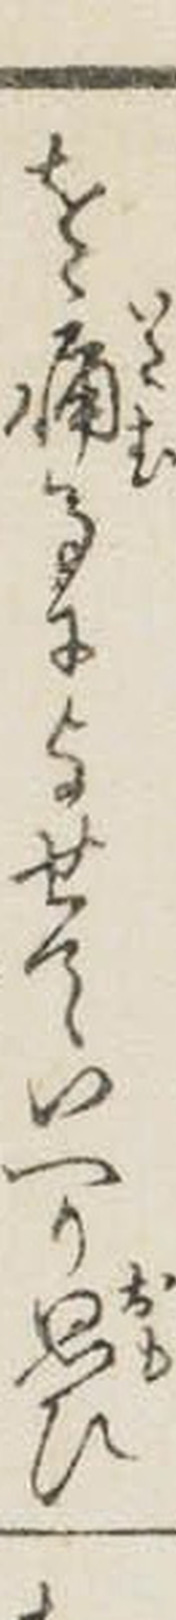を痛るによせていへり思ひ
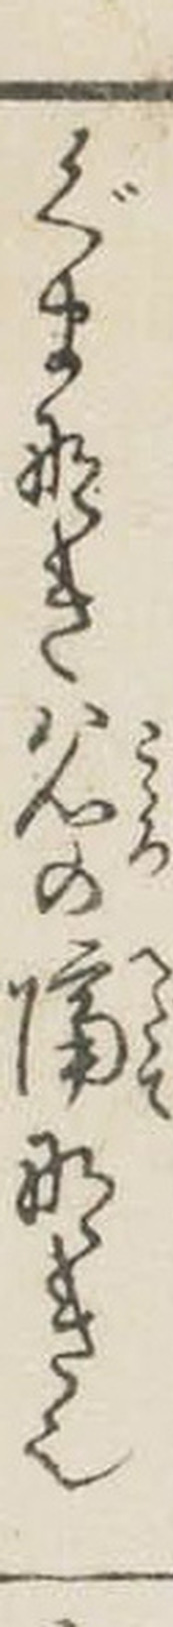ぐまなきは心の隔なき也

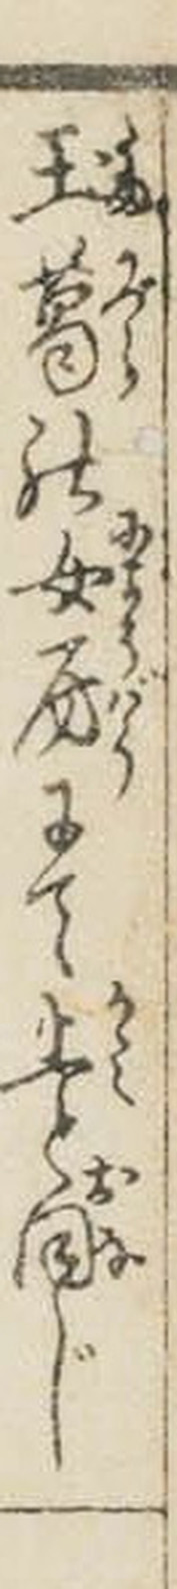玉葛の女房にて上と同じ
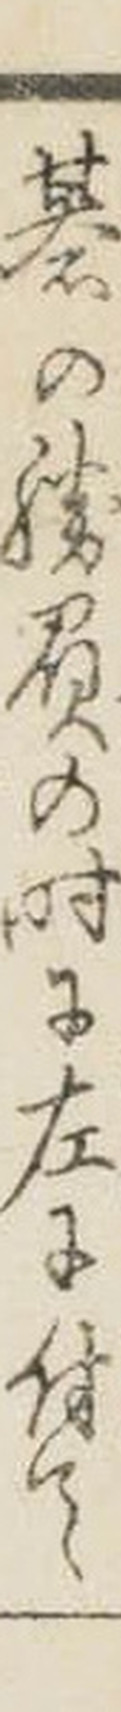碁の勝負の時に左に付て
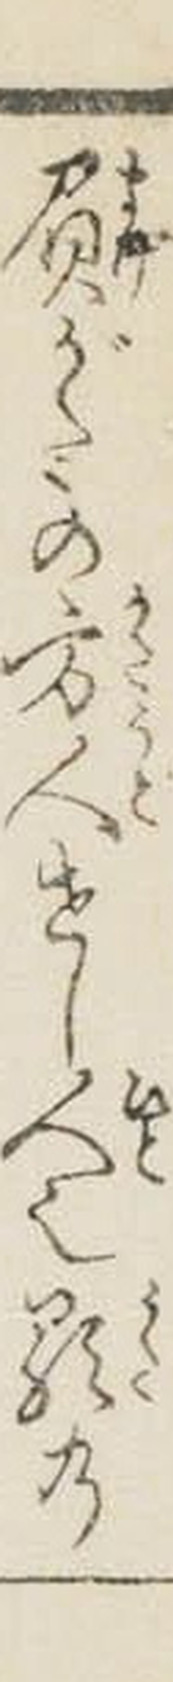負がたの方人せし人也歌の
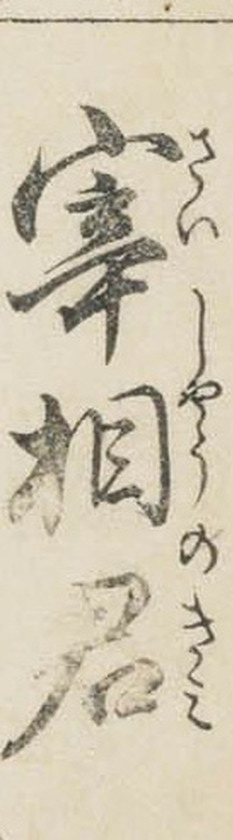宰相君
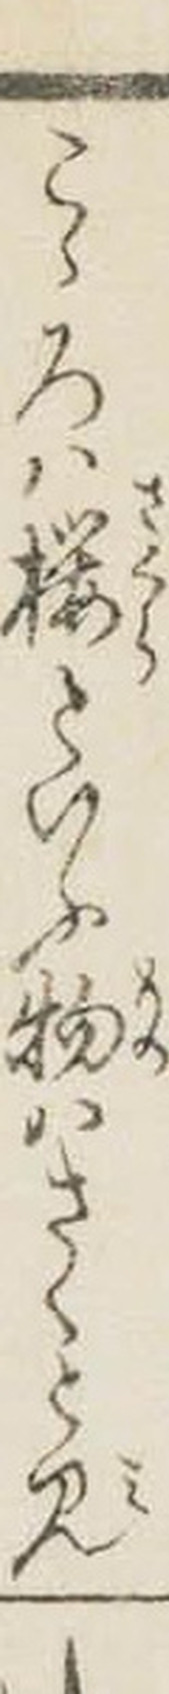こゝろは桜といふ物はさくと見
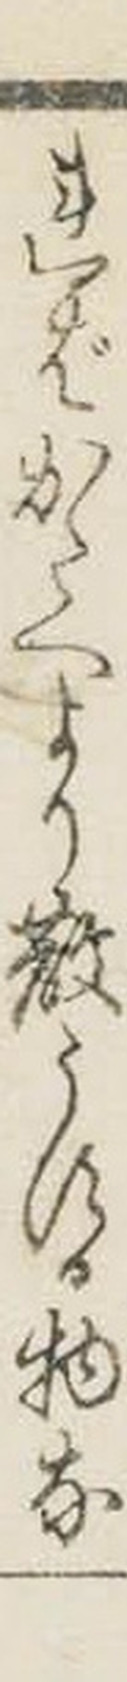ればかたへより散うする物な
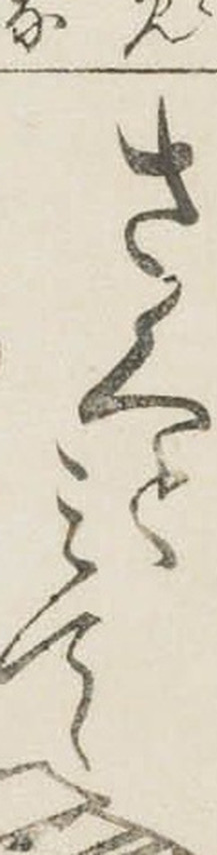さくとみて
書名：源氏百人一首
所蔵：東京学芸大学教育コンテンツアーカイブ
